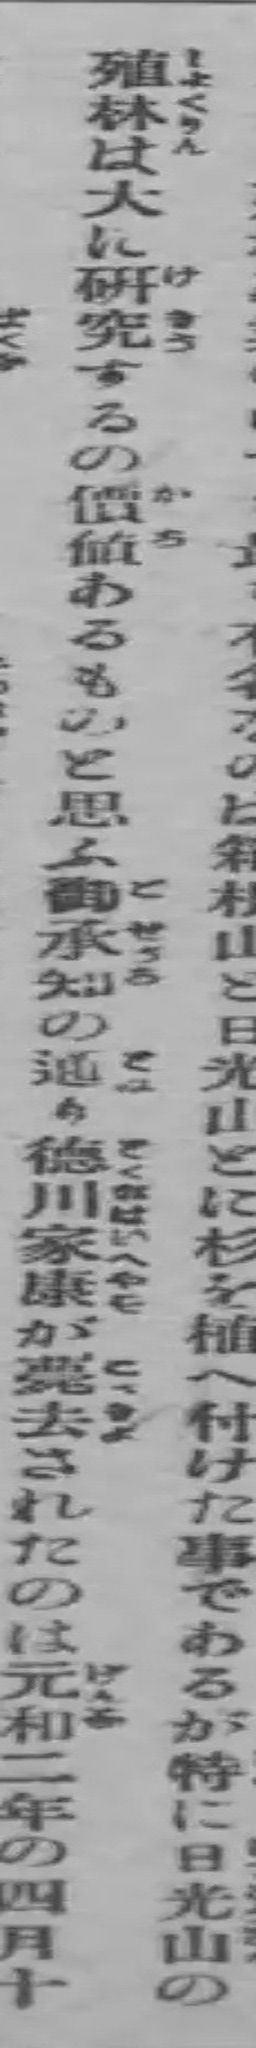殖林は大に研究するの価値あるものと思ふ御承知の通り徳川家康が薨去されたのは元和二年の四月十
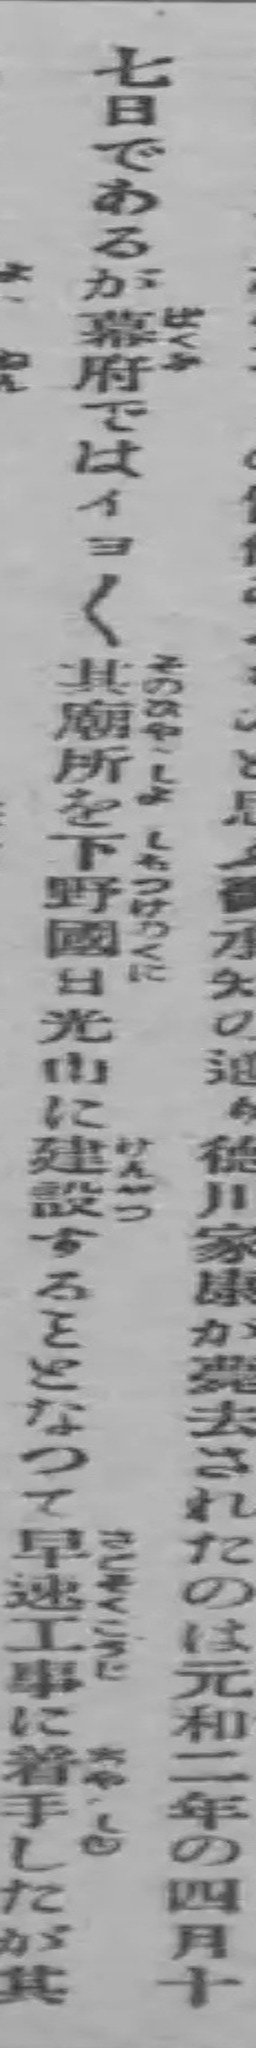七日であるが幕府ではイヨ〳〵其廟所を下野国日光山に建設することとなつて早速工事に着手したが其
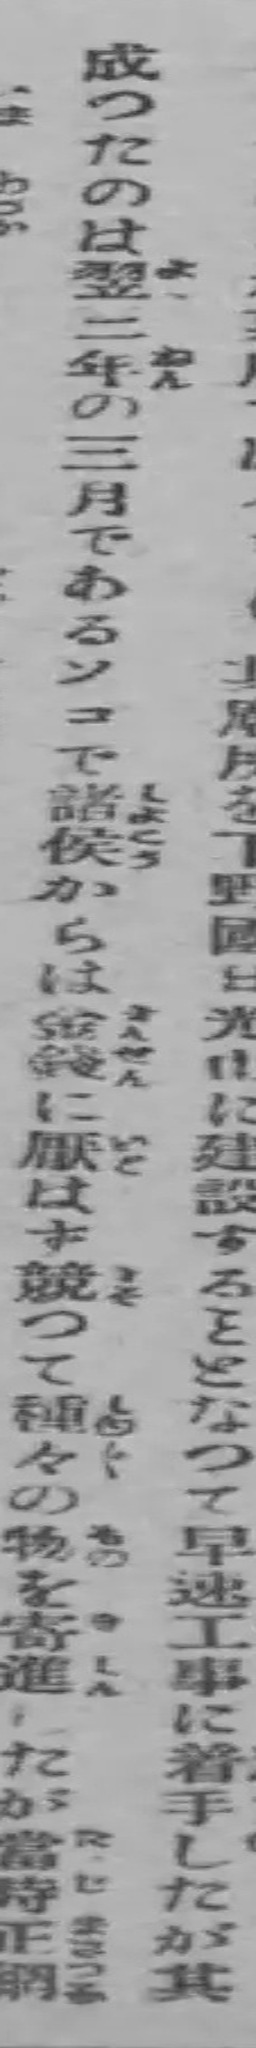成つたのは翌二年の三月であるソコで諸侯からは金銭に厭はず競つて種々の物を寄進したが当時正綱
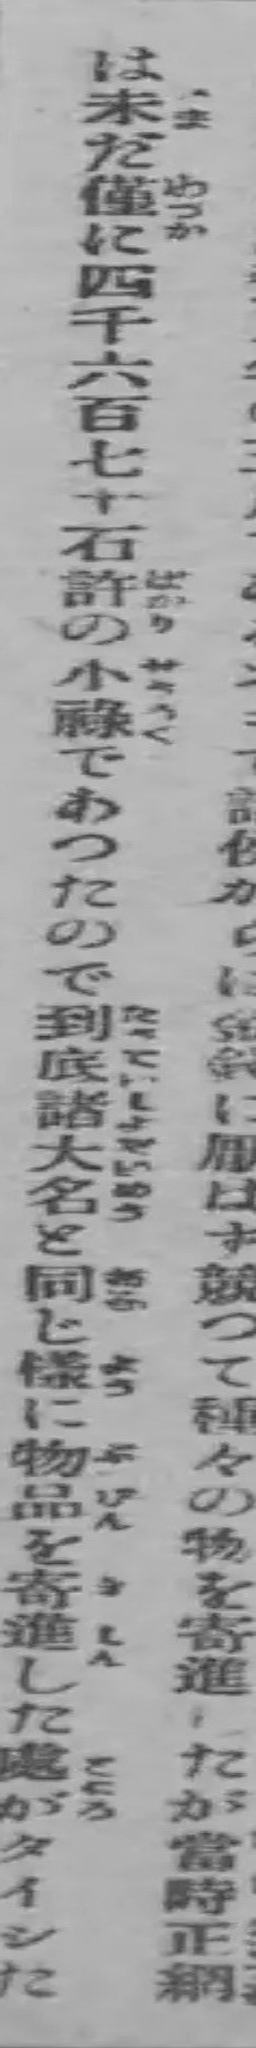は未だ僅に四千六百七十石許の小禄であつたので到底諸大名と同じ様に物品を寄進した処がタイシた
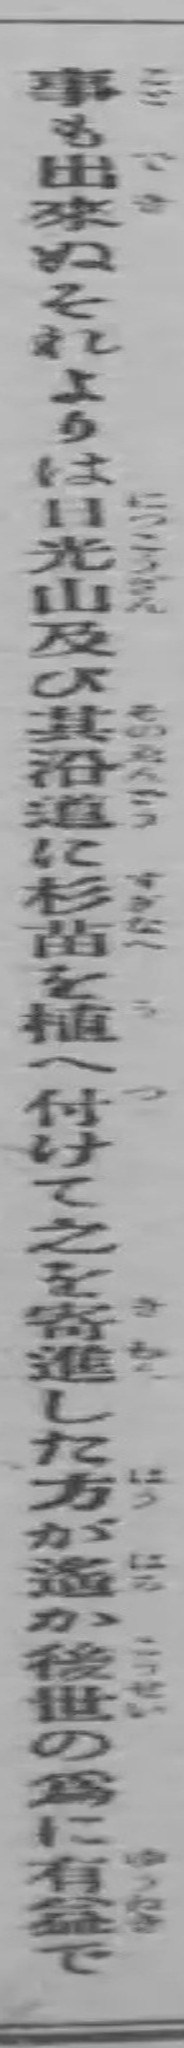事も出来ぬそれよりは日光山及び其沿道に杉苗を植へ付けて之を寄進した方が遥か後世の為に有益で
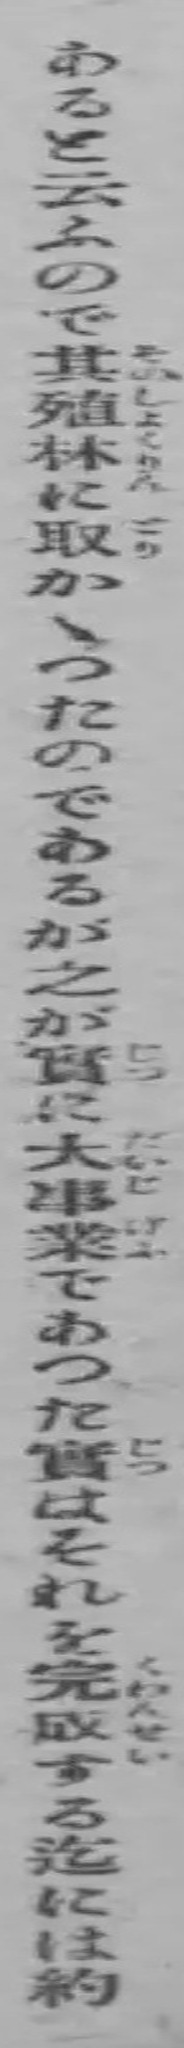あると云ふので其殖林に取かゝつたのであるが之が実に大事業であつた実はそれを完成する迄には約
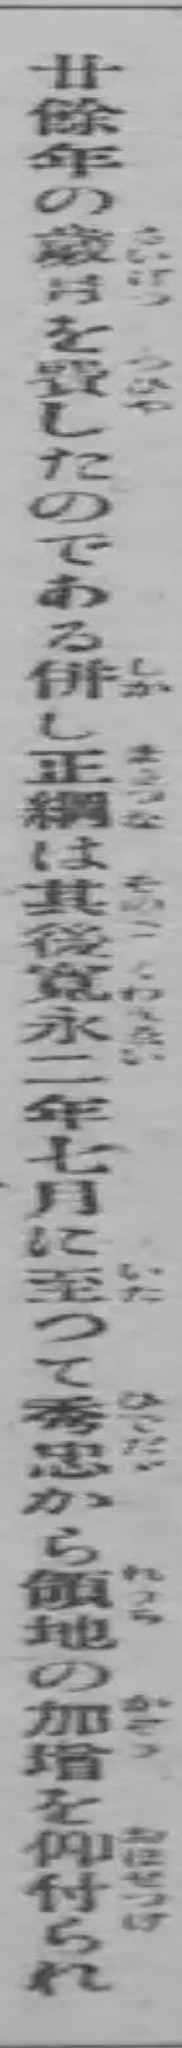廿余年の歳月を費したのである併し正綱は其後寛永二年七月に至つて秀忠から領地の加増を仰付られ
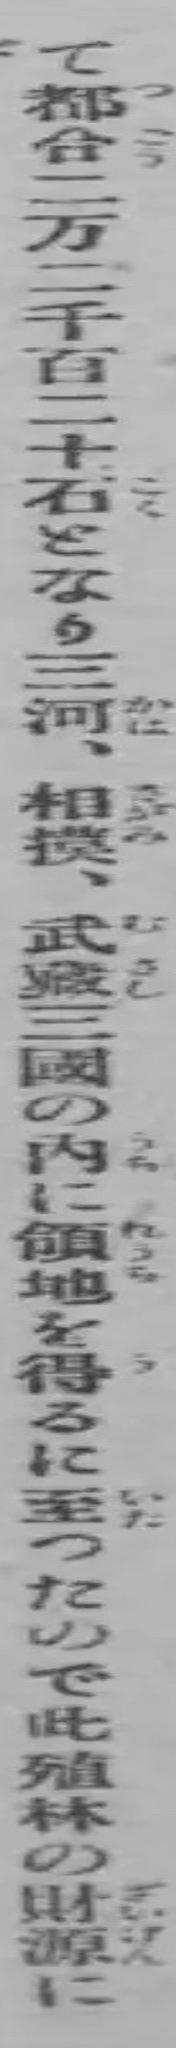て都合二万二千百二十石となり三河、相模、武蔵三国の内に領地を得るに至つたので此殖林の財源に
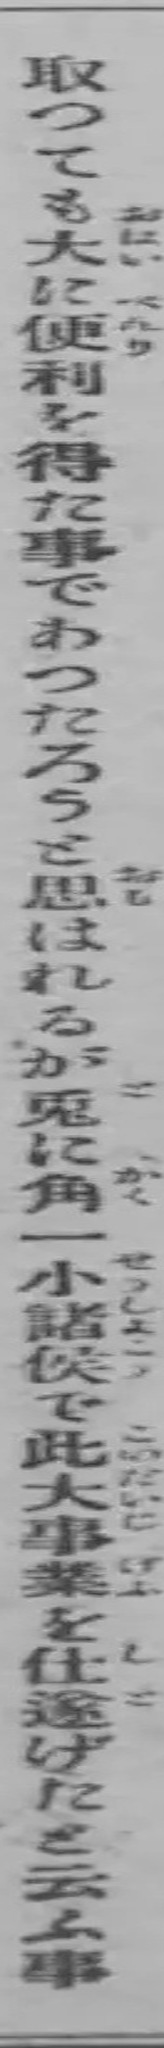取つても大に便利を得た事であつたろうと思はれるが兎に角一小諸侯で此大事業を仕遂げたと云ふ事
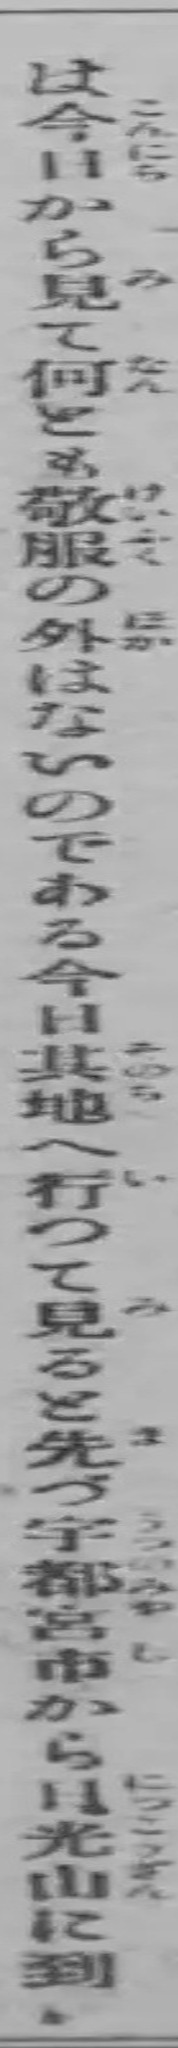は今日から見て何とも敬服の外はないのである今日其地へ行つて見ると先づ宇都宮市から日光山に到
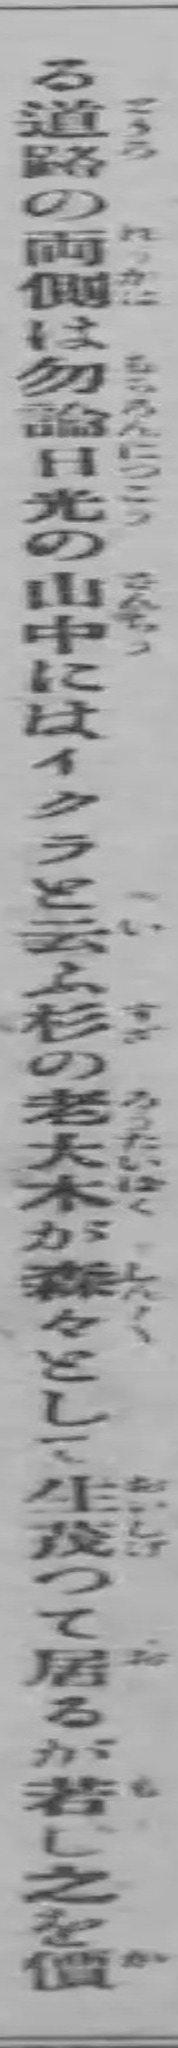る道路の両側は勿論日光の山中にはイクラと云ふ杉の老大木が森々として生茂つて居るが若し之を価
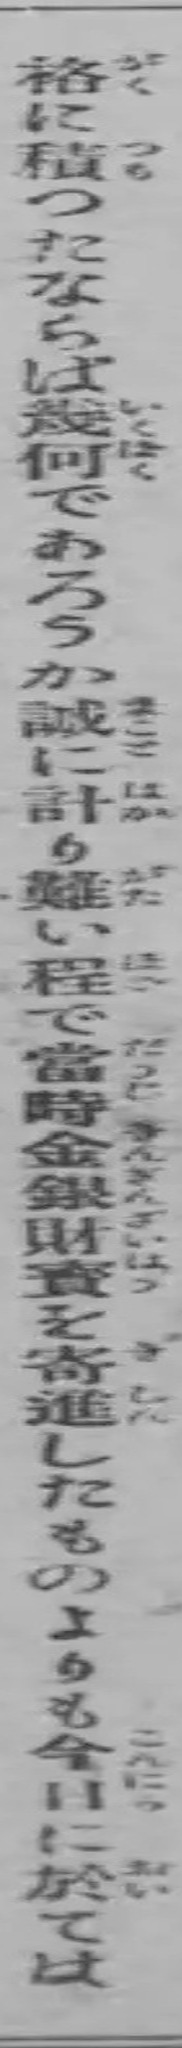格に積つたならば幾何であろうか誠に計り難い程で当時金銀財宝を寄進したものよりも今日に於ては
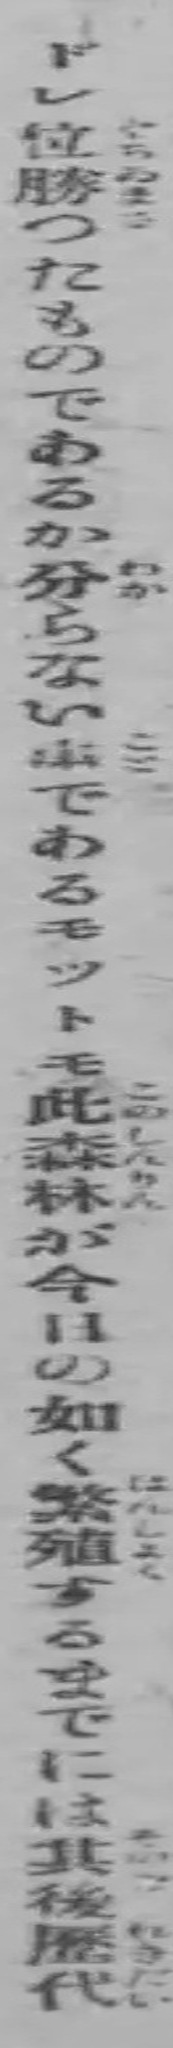ドレ位勝つたものであるか分らない事であるモツトモ此森林が今日の如く繁殖するまでには其後歴代
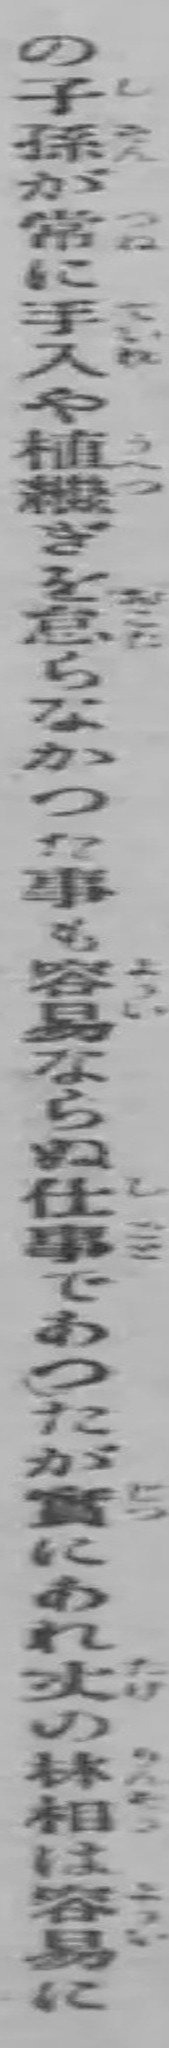の子孫が常に手入や植継ぎを怠らなかつた事も容易ならぬ仕事であつたが実にあれ丈の林相は容易に
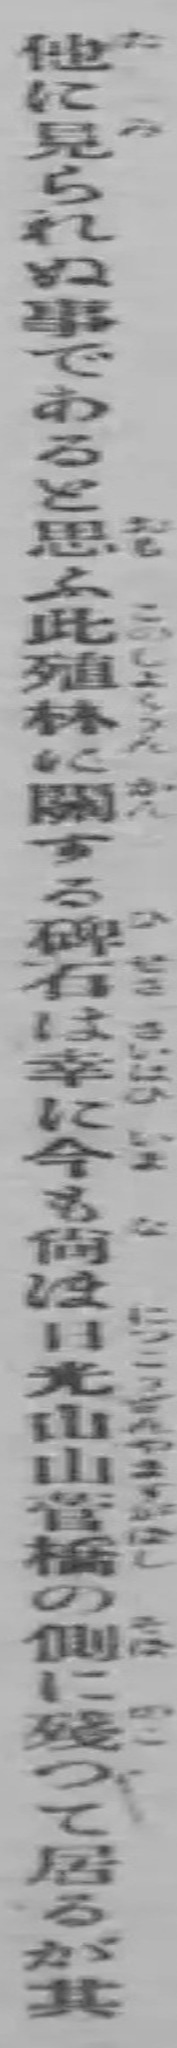他に見られぬ事であると思ふ此殖林に関する碑石は幸に今も尚ほ日光山山菅橋の側に残つて居るが其
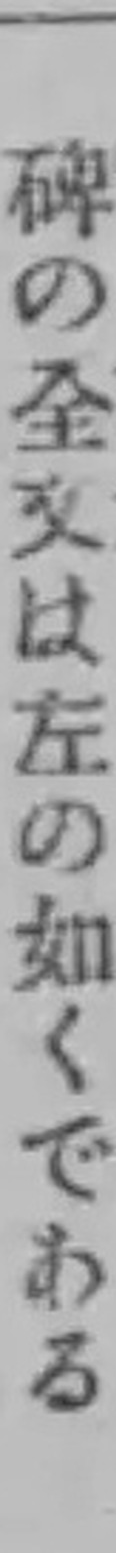碑の全文は左如くである
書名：豊橋市史談
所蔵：国立国会図書館 National Diet Library, JAPAN
